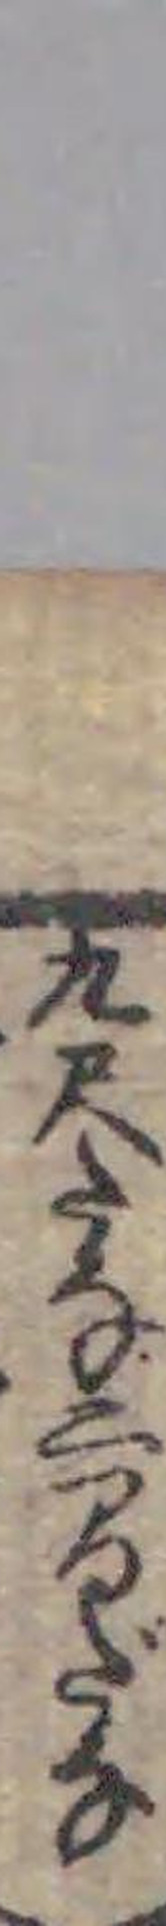九尺たな二間だな
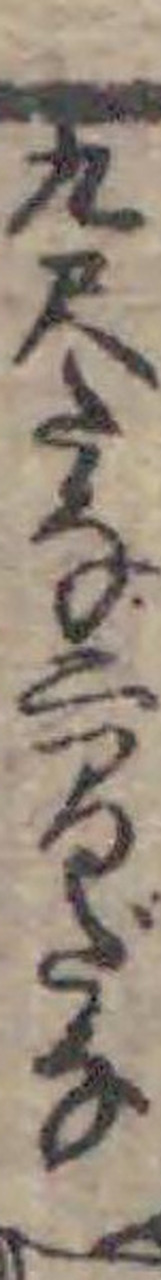九尺たな二間だな
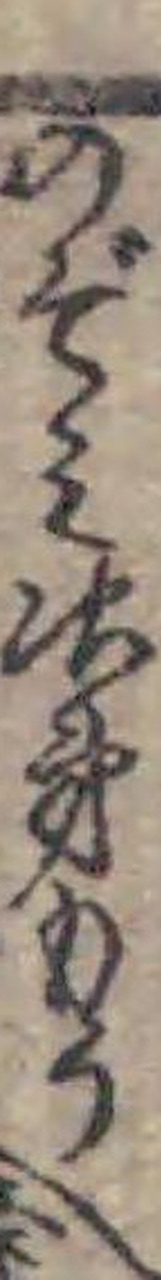のぞみ次第もう
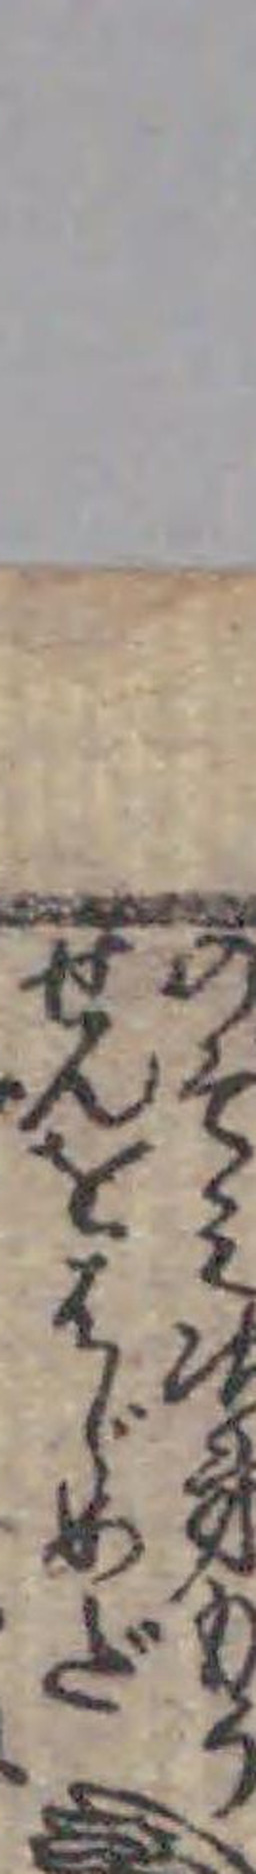せんをはじめだ
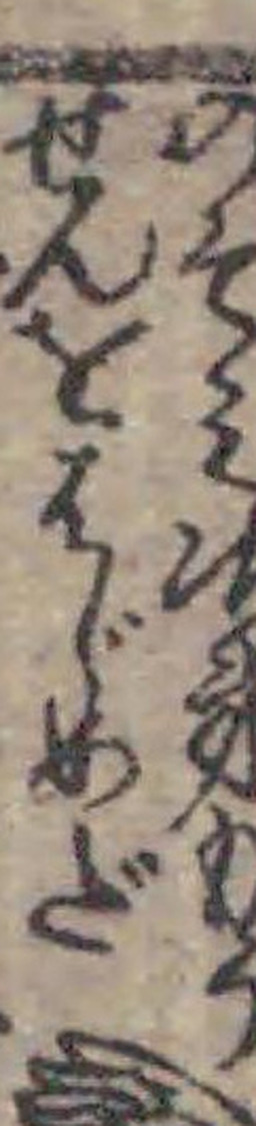せんをはじめだ
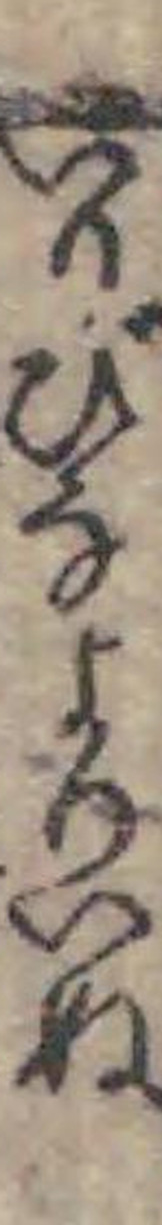いりびなよりいぬ
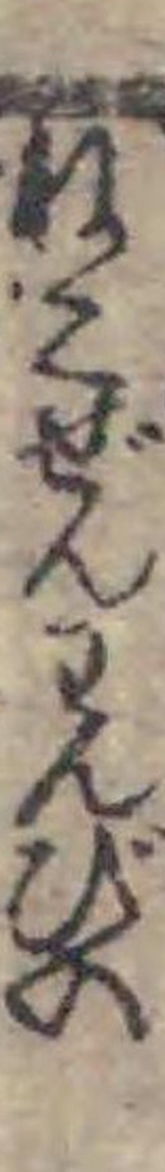ねこぜんわんびい
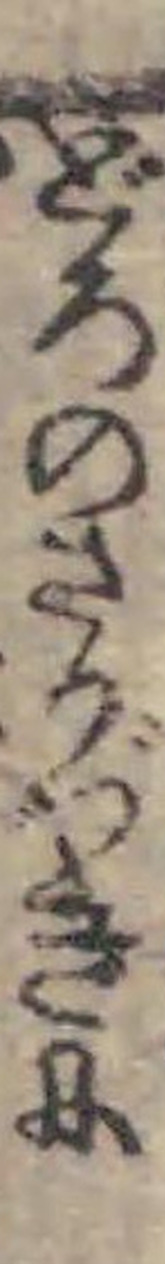どろのさかづきに
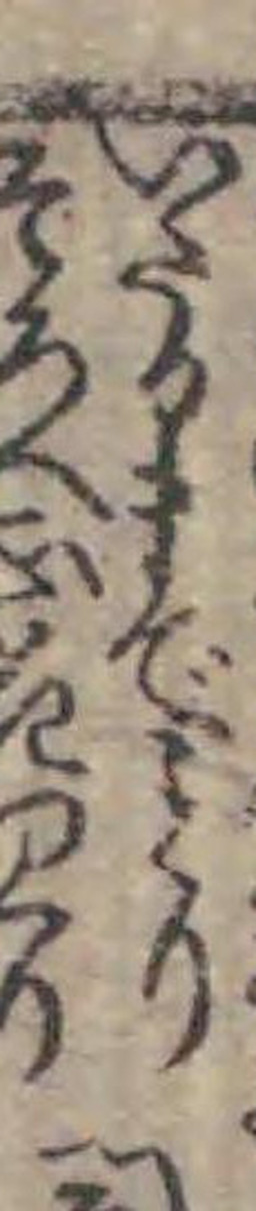そろへ正花つくり
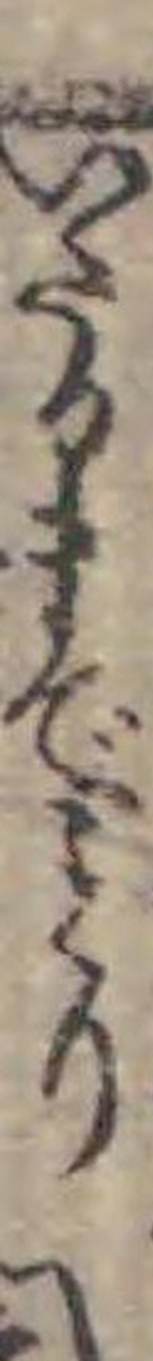いたるまでとり
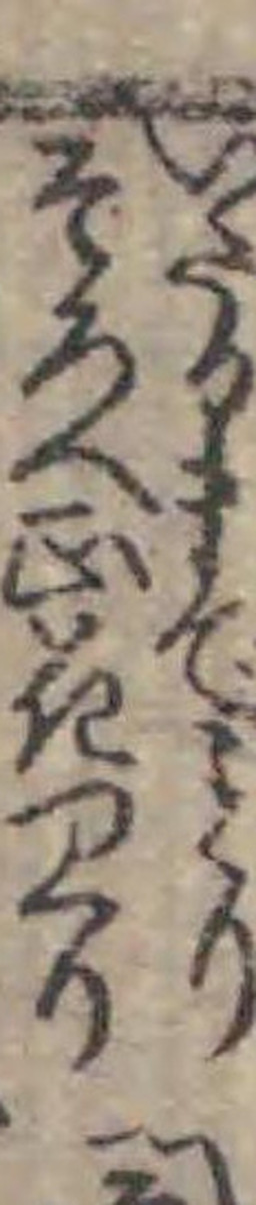そろへ正花つくり
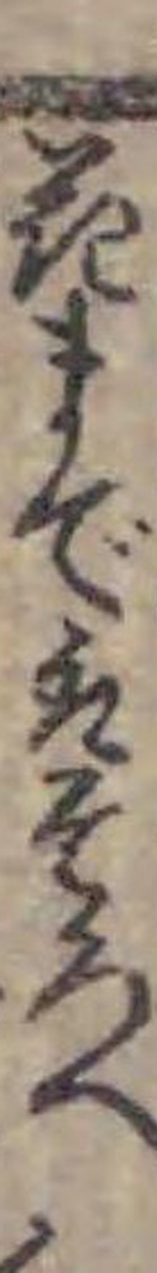花まで取そろへ
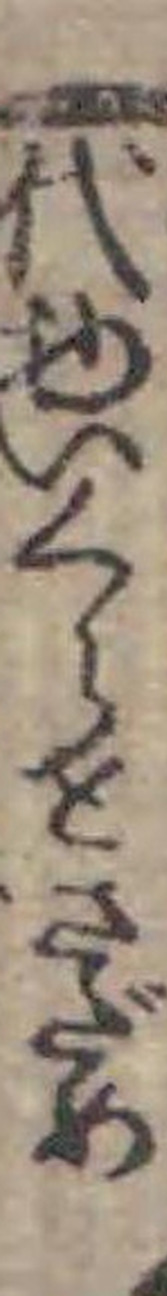代物いくらをさだめ
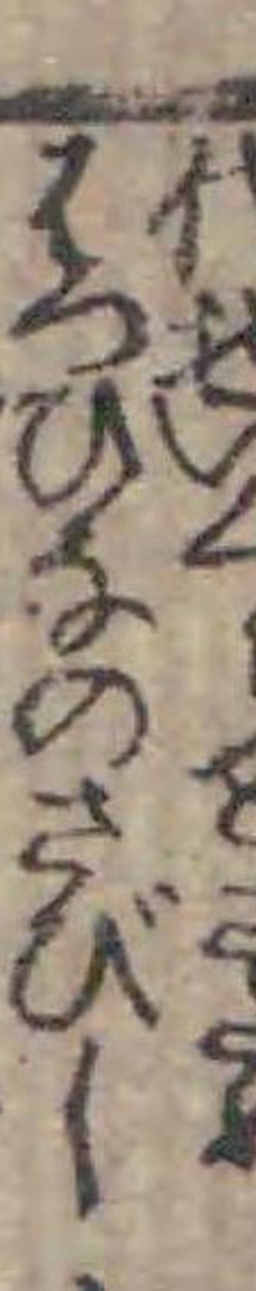はつひなのさびし
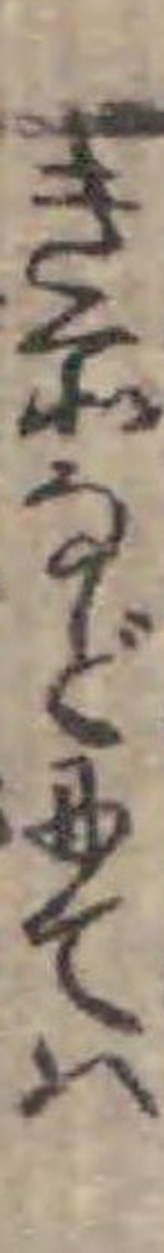き所などにては
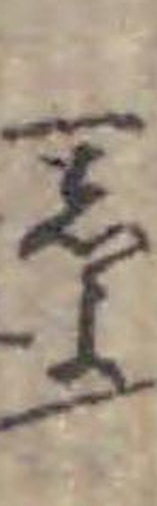一しよ
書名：本樹真猿浮気噺 : 3巻
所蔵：国立国会図書館 National Diet Library, JAPAN
